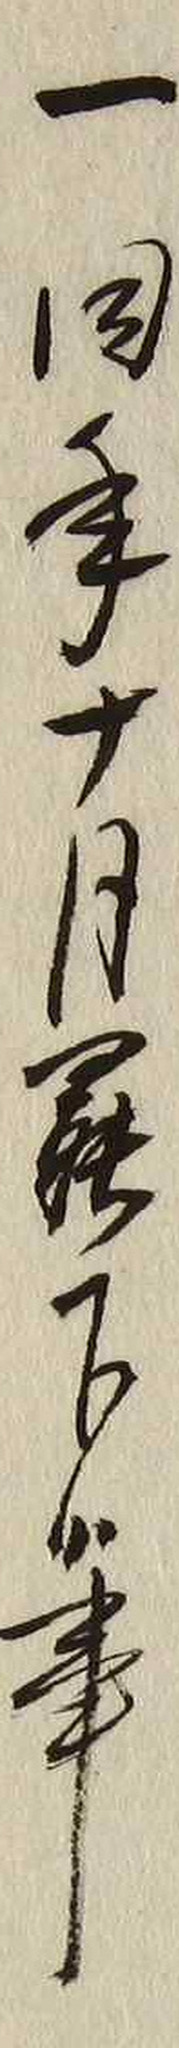一同年十月罷下候事
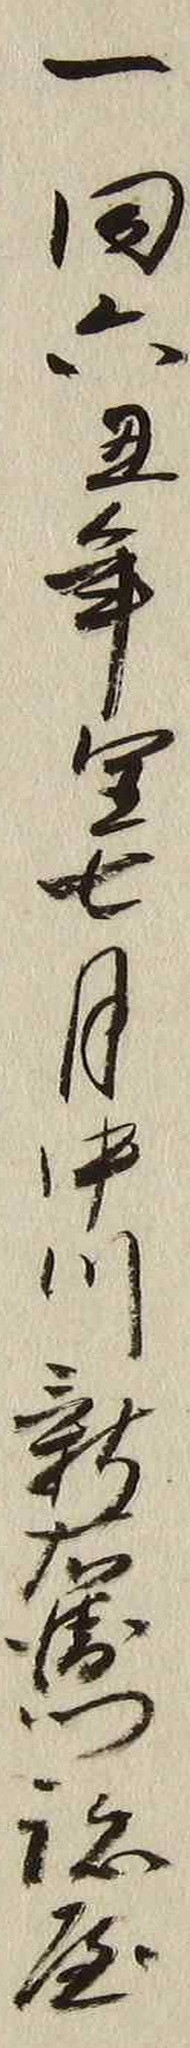一同六丑年閏七月中川新右衛門跡屋
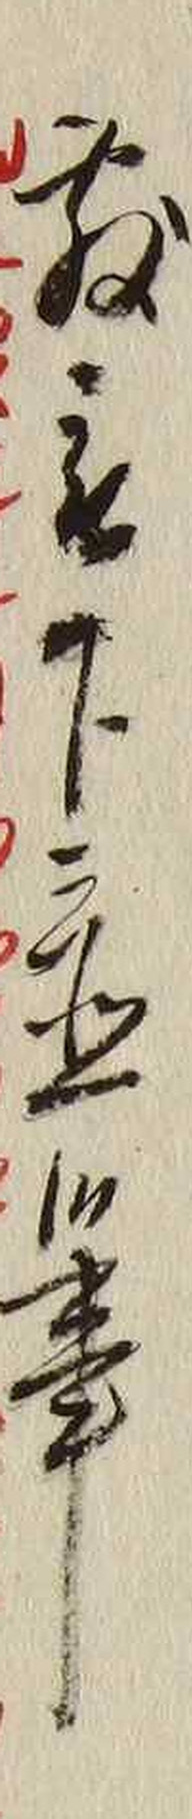敷被下置候事
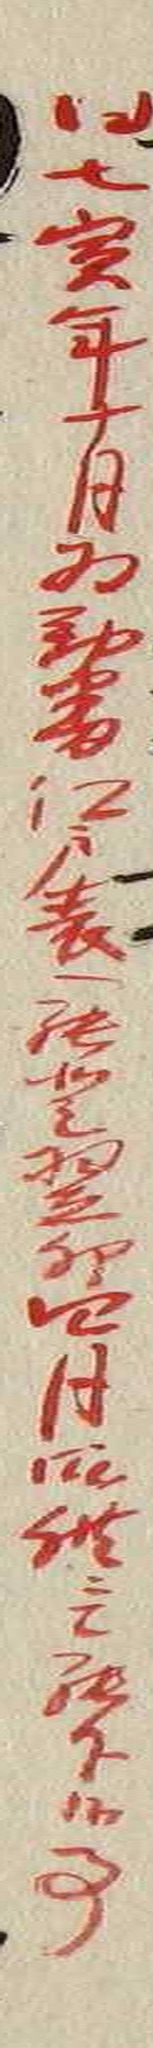一同七寅年十月為勤番江戸表へ罷登翌卯四月御供ニて罷下候事
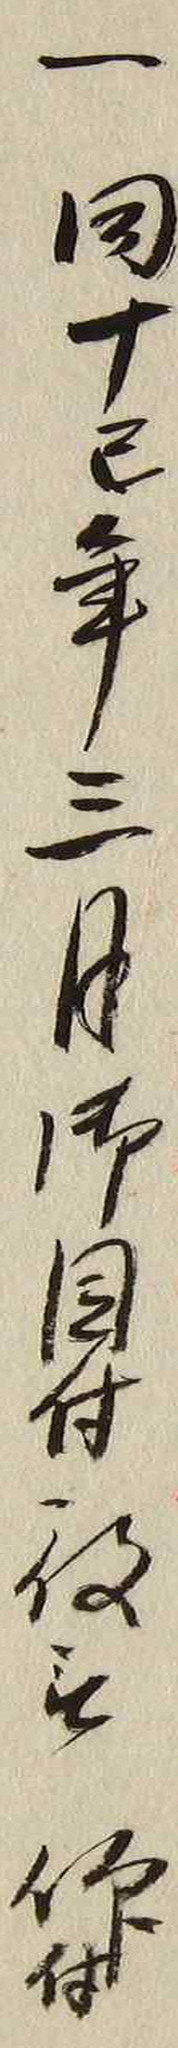一同十巳年三月御目付役被仰付
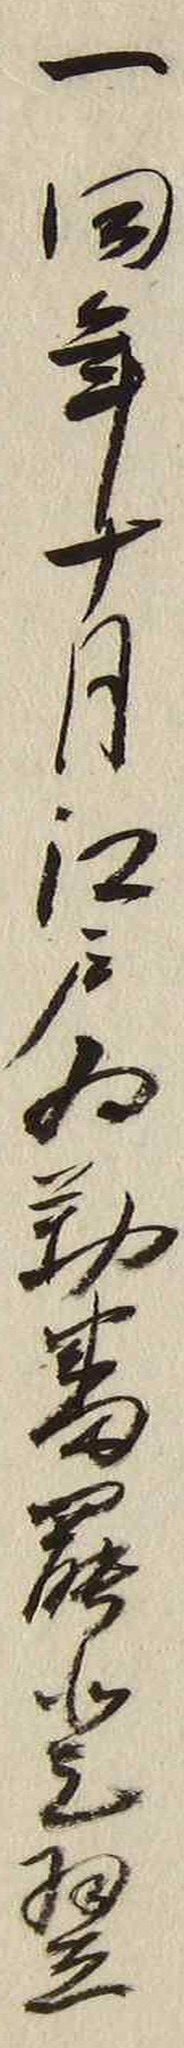一同年十月江戸為勤番罷登翌
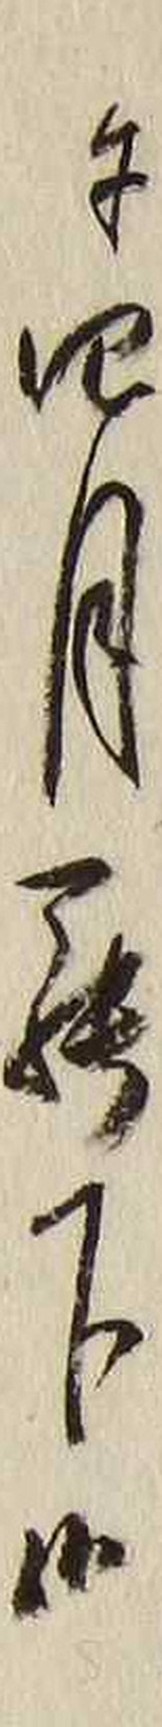午四月罷下候

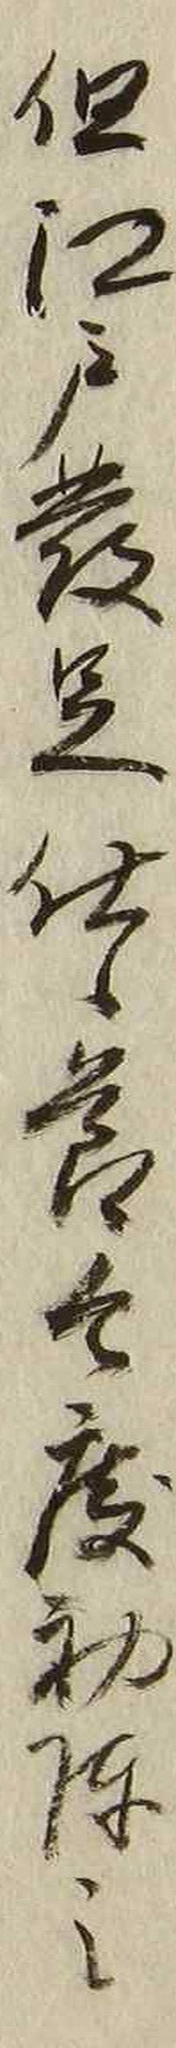但江戸発足仕候節今度初陣之
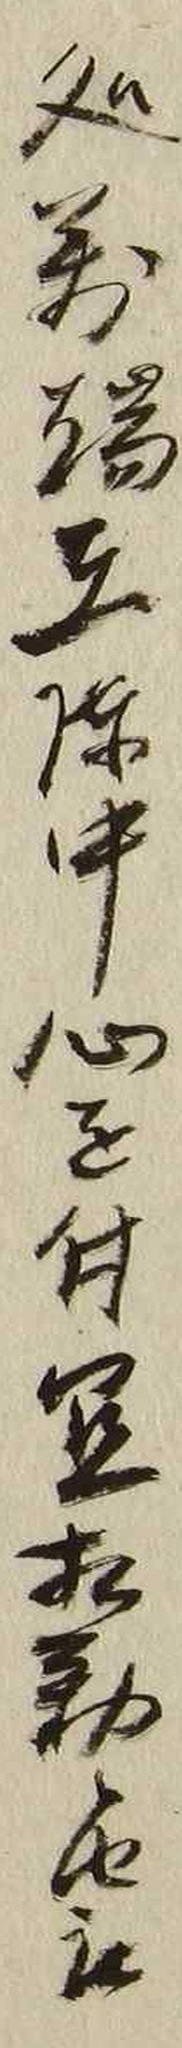処万端在陣中心を付宜相勤候由被
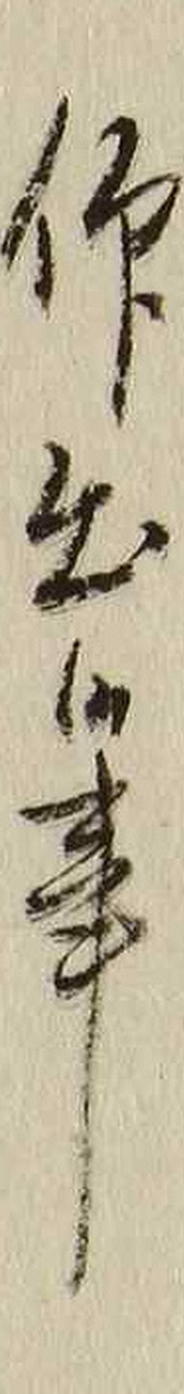仰出候事
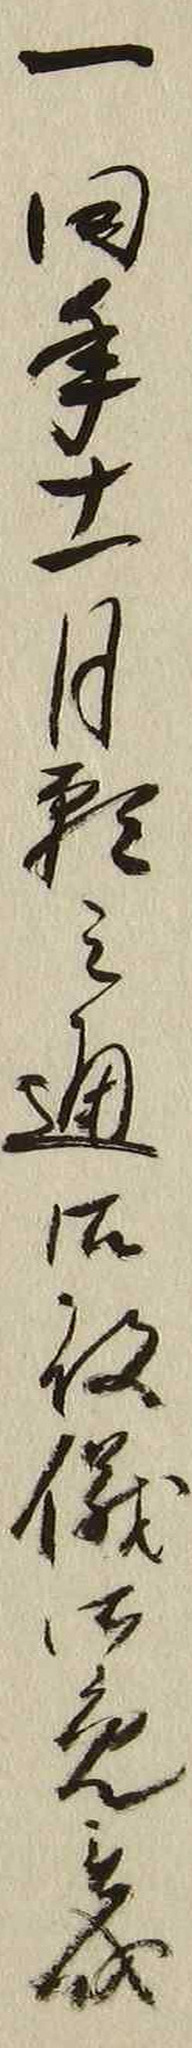一同年十一月願之通御役儀御免被成
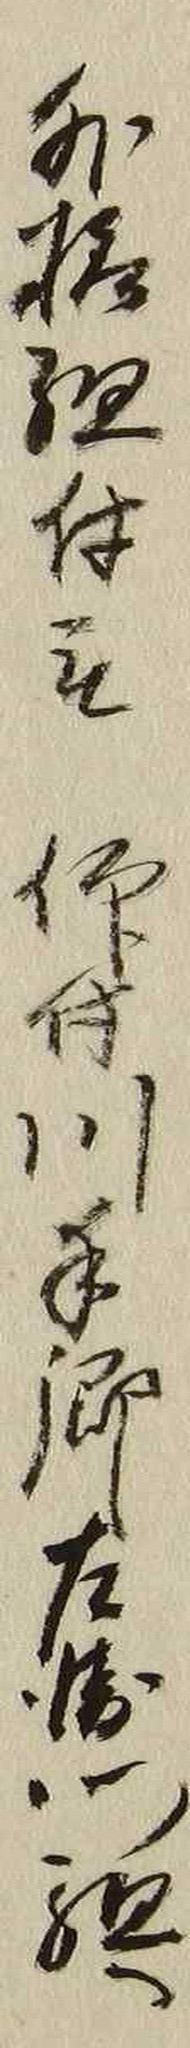外様組付被仰付川手郷左衛門組へ
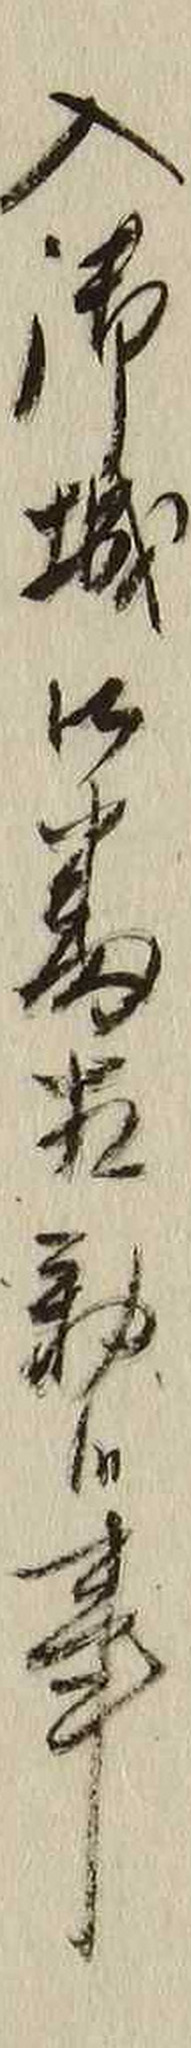入御城御番相勤候事
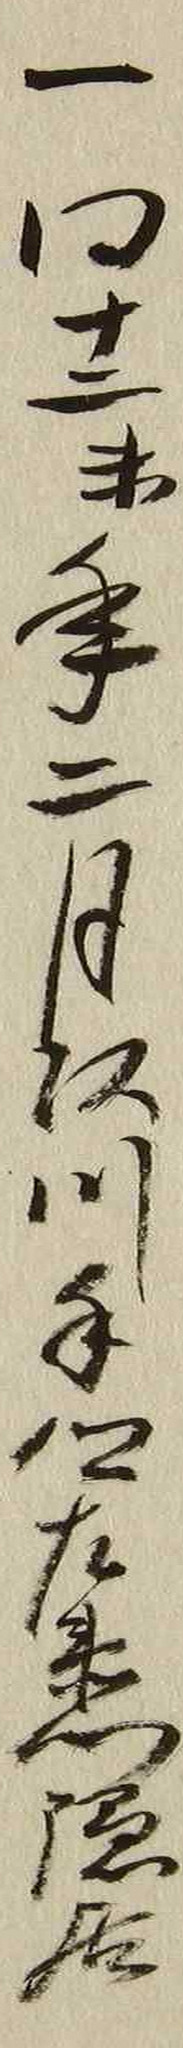一同十二未年二月頭川手郷左衛門隠居
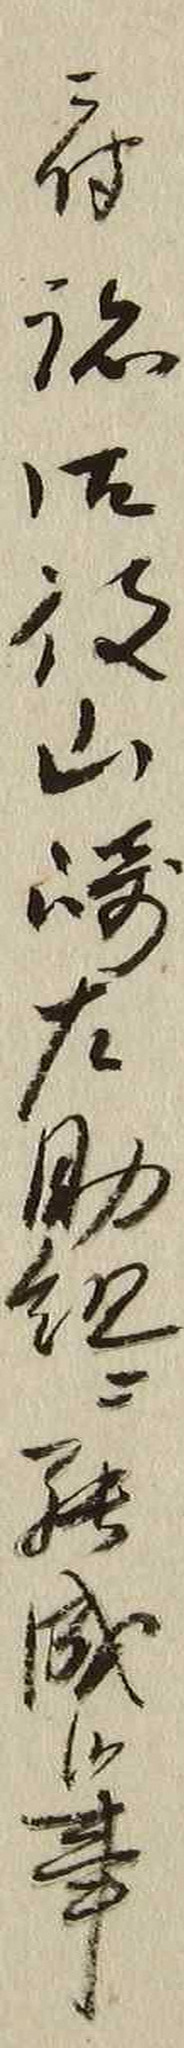ニ付跡御役山崎左助組ニ罷成候事
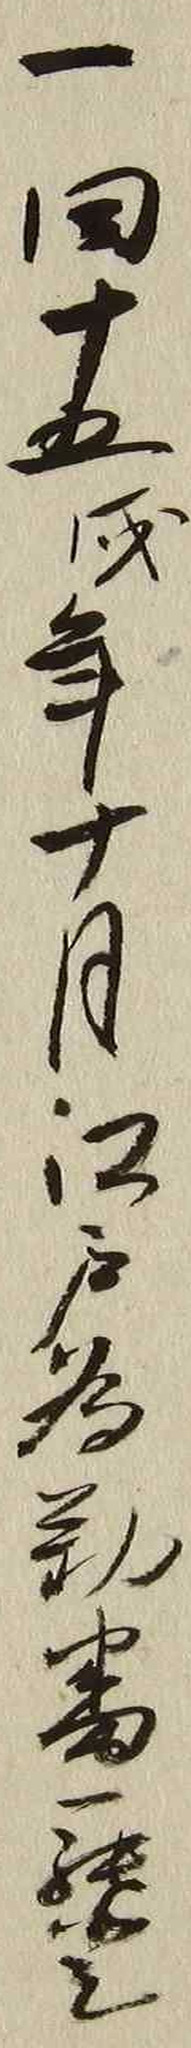一同十五戌年十月江戸為勤番罷登
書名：諸士系譜　巻之346　も之部2
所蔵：会津若松市立会津図書館
